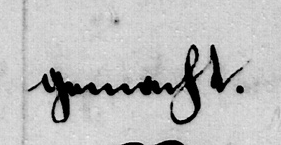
gemacht.
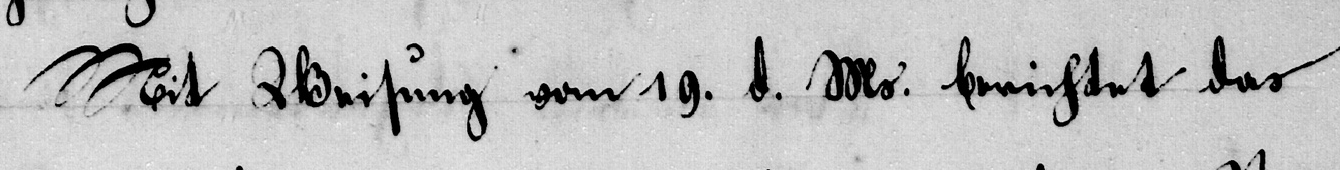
Mit Weisung vom 19. d. Ms. berichtet das
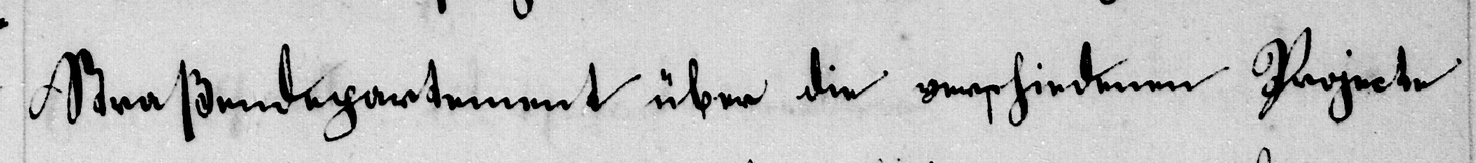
Straßendepartement über die verschiedenen Projecte
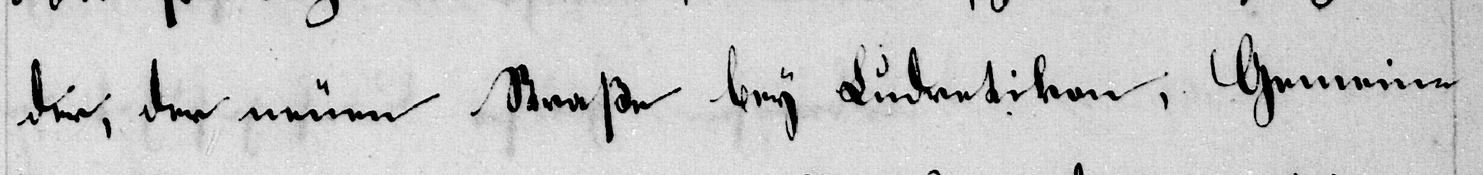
der, der neuen Straße bey Ludretikon, Gemein¬
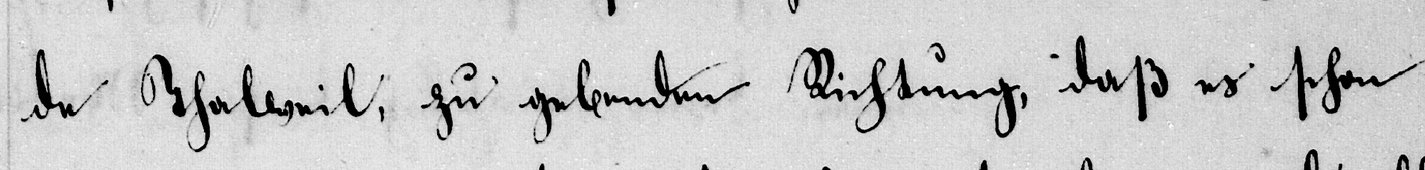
de Thalweil, zu gebenden Richtung, daß es schon
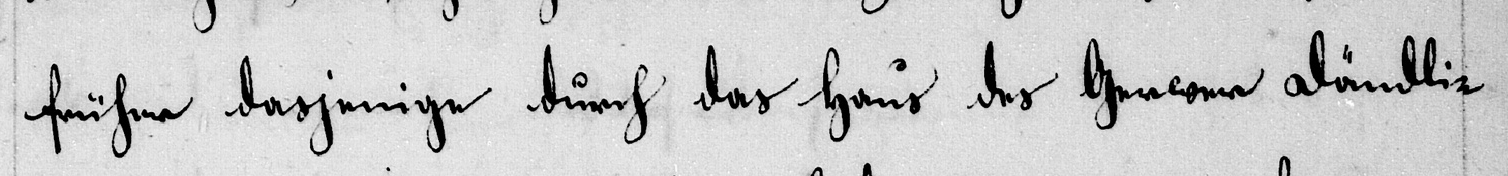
früher dasjenige durch das Haus des Gerwer Dändli¬
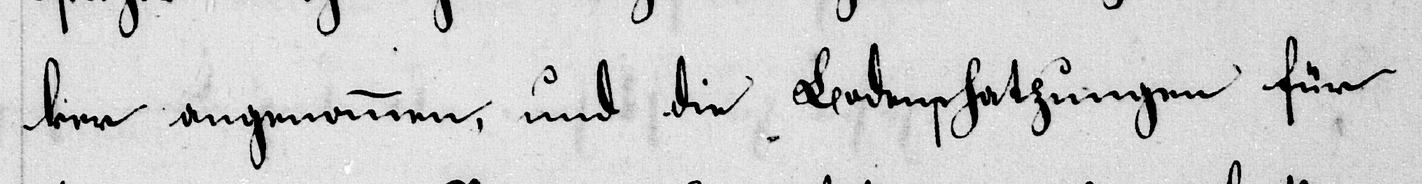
ker angenommen, und die Bodenschatzungen für
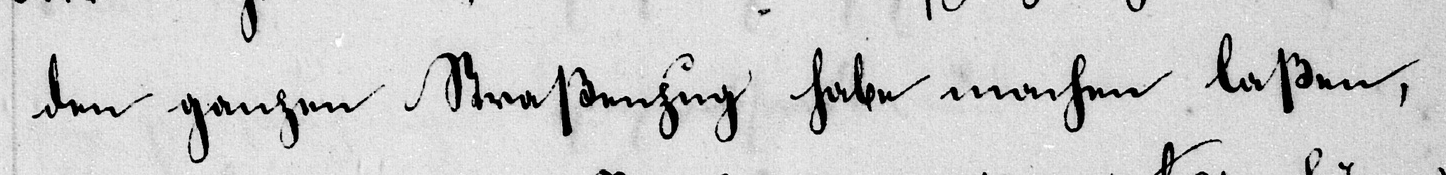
den ganzen Straßenzug habe machen laßen,
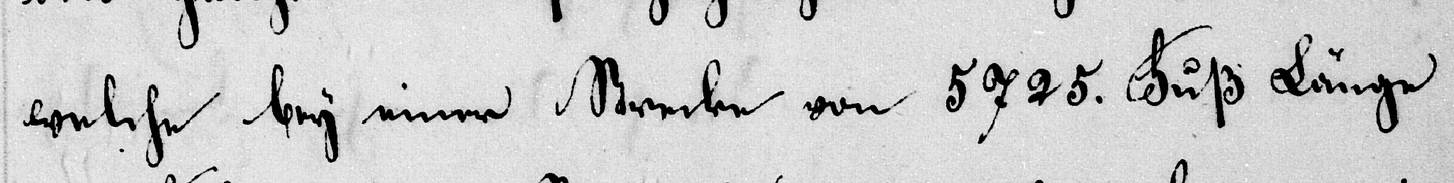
welche bey einer Strecke von 5725. Fuß Länge
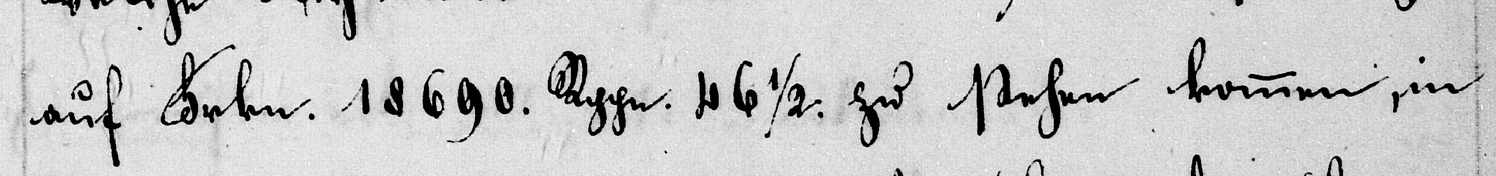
auf Frkn. 18690. Rppn. 461/2 zu stehen kommen, in
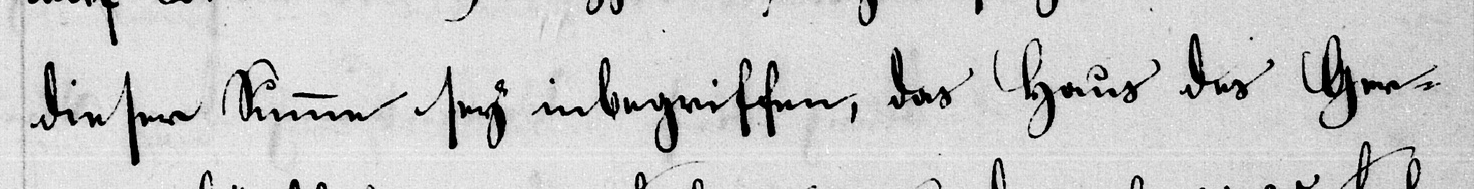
dieser Summe sey inbegriffen, das Haus des Ger¬
